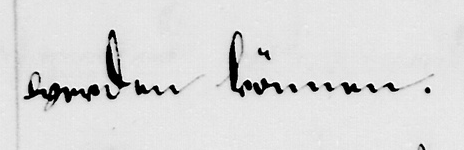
werden können.
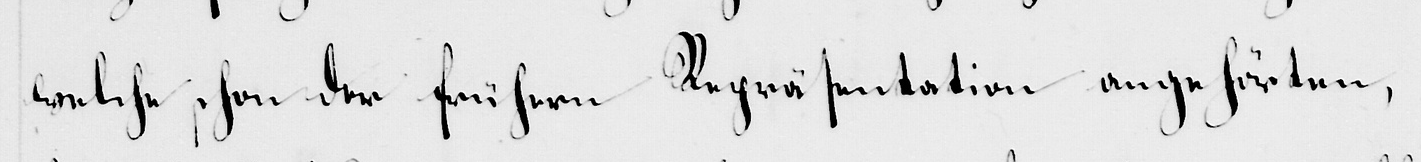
welche schon der frühern Repräsentation angehörten,
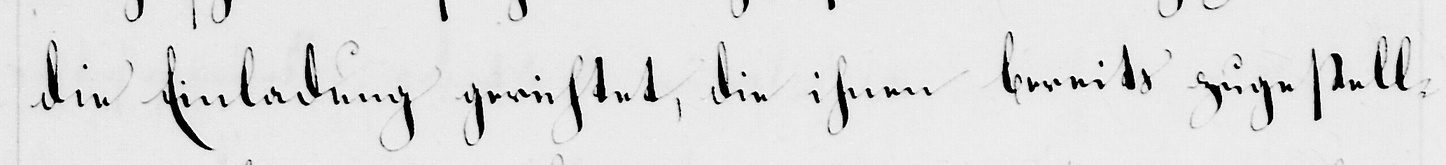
die Einladung gerichtet, die ihnen bereits zugestell¬
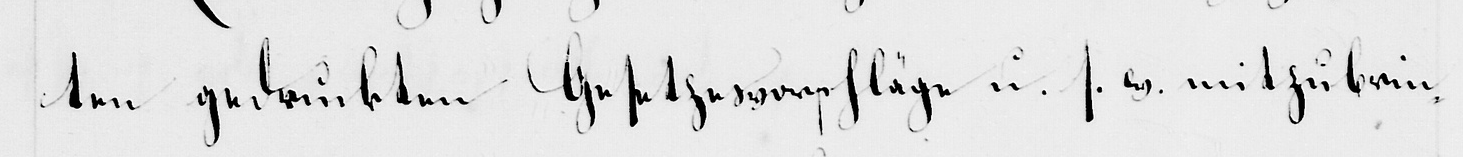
ten gedruckten Gesetzesvorschläge u. s. w. mitzubrin¬
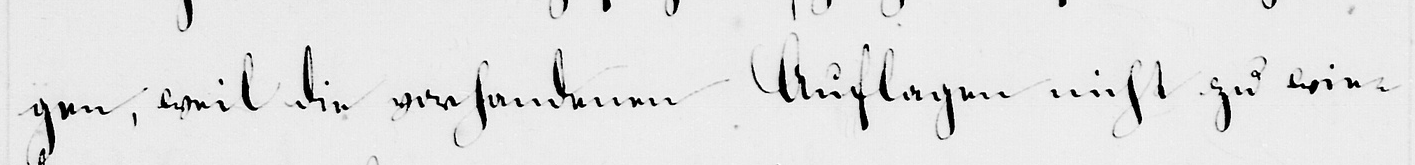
gen, weil die vorhandenen Auflagen nicht zu wie¬
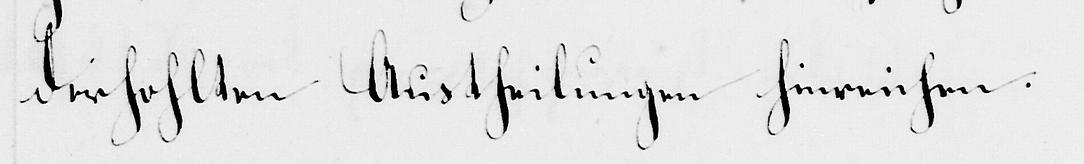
derhohlten Austheilungen hinreichen.
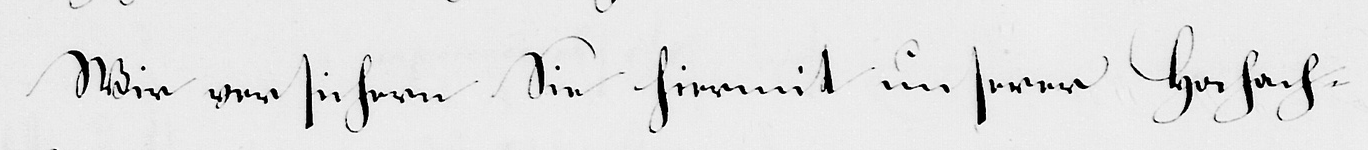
Wir versichern Sie hiermit unserer Hochach¬
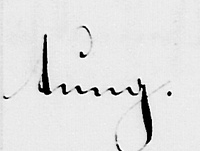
tung.
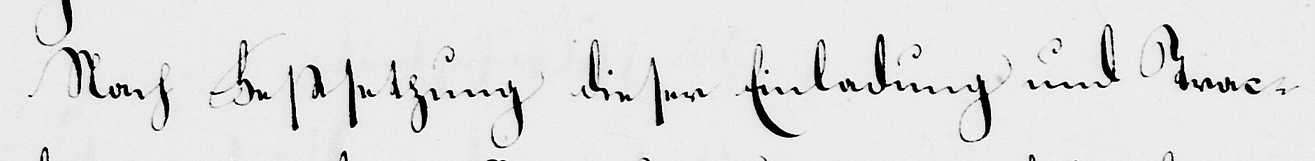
Nach Festsetzung dieser Einladung und Trac¬
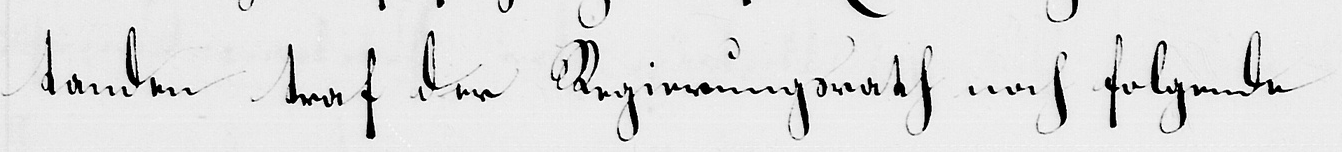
tanden traf der Regierungsrath noch folgende
